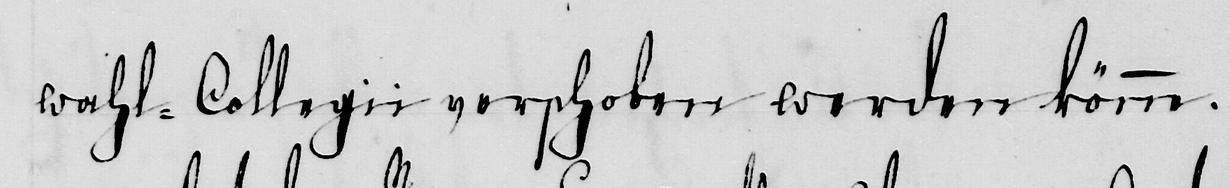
wahl-Collegii verschoben werden könne.
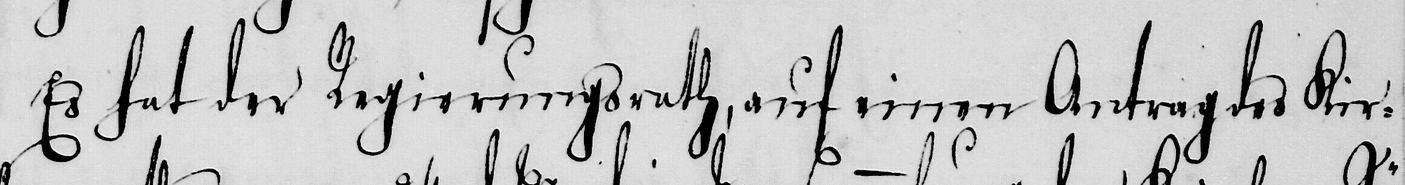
Es hat der Regierungsrath, auf den Antrag des Kir¬
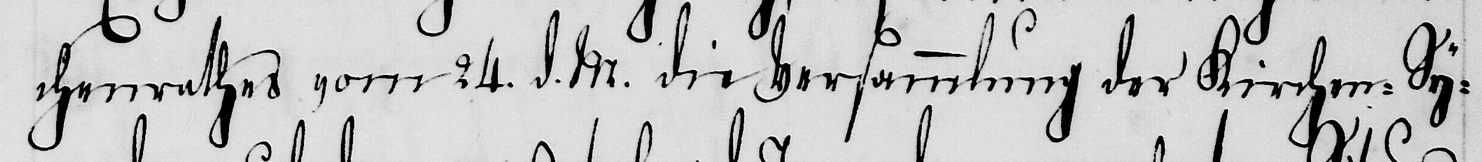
chenrathes vom 24. d. M. die Versammlung der Kirchen-Sy¬
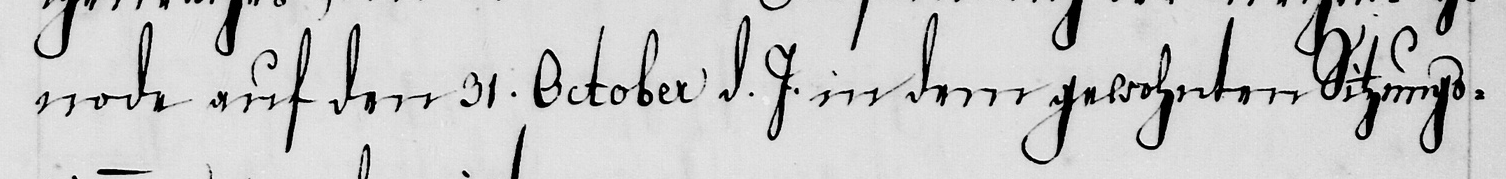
node auf den 31. October d. J. in dem gewohnten Sitzungs¬
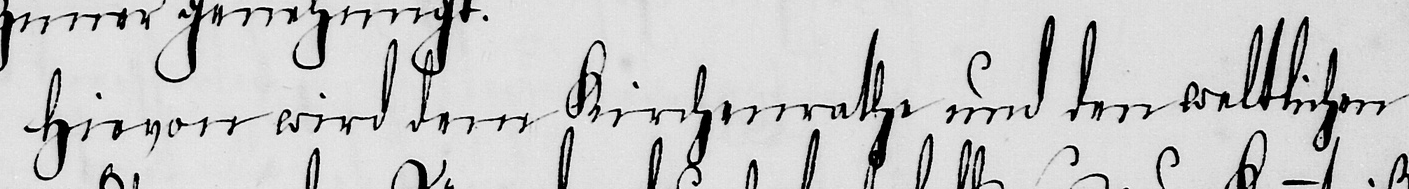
Hievon wird dem Kirchenrathe und den weltlichen
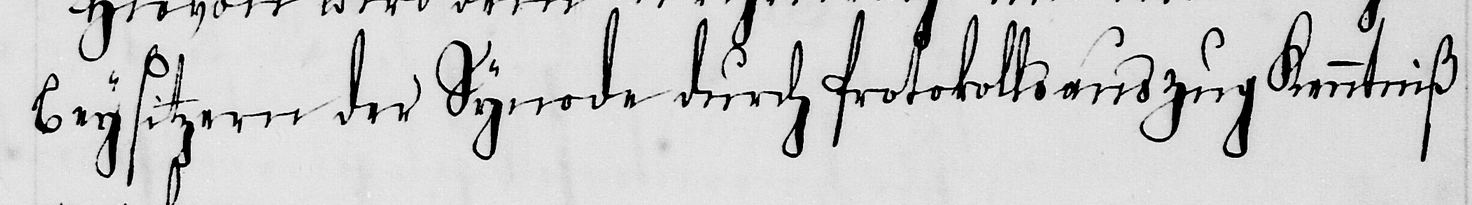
Beysitzern der Synode durch Protokollsauszug Kenntniß
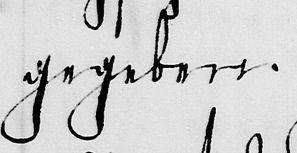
gegeben.
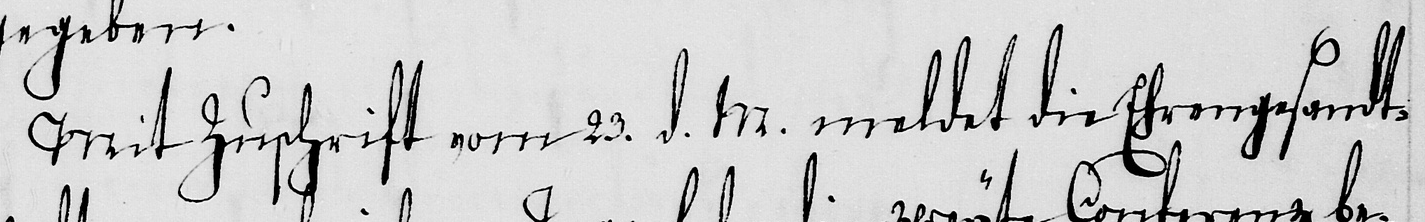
Mit Zuschrift vom 23. d. M. meldet die Ehrengesandt¬
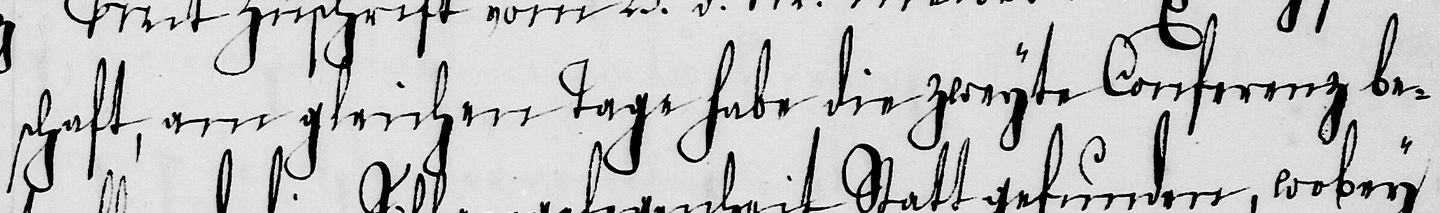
schaft, am gleichen Tage habe die zweyte Conferenz be¬
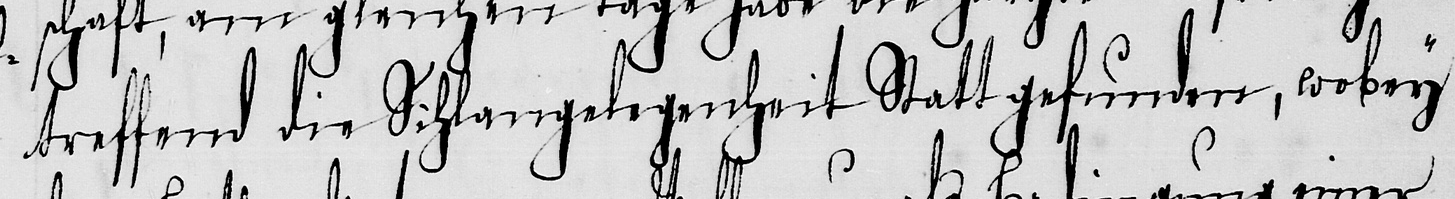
treffend die Sihlangelegenheit Statt gefunden, wobey
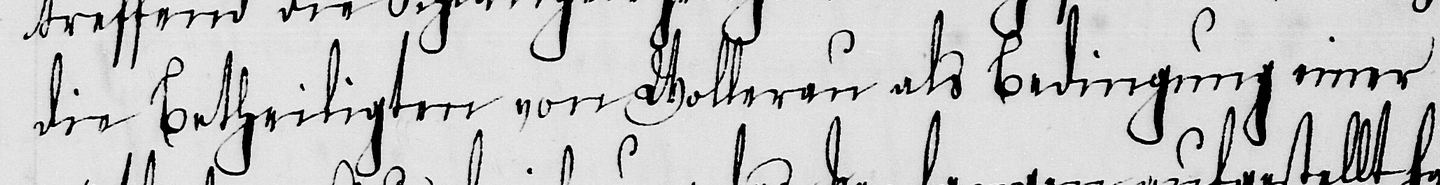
die Betheiligten von Wollerau als Bedingung einer
